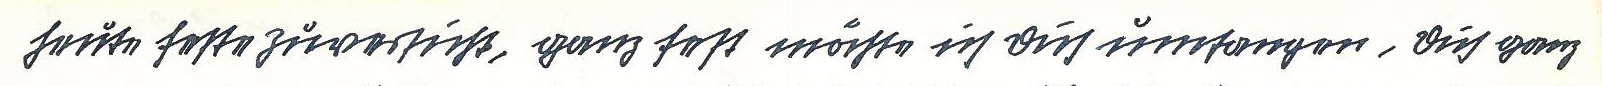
heute feste Zuversicht, ganz fest möchte ich Dich umfangen, Dich ganz
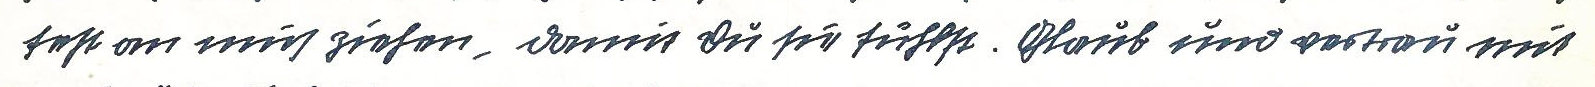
fest an mich ziehen, damit Du sie fühlst. Glaub und vertrau mit
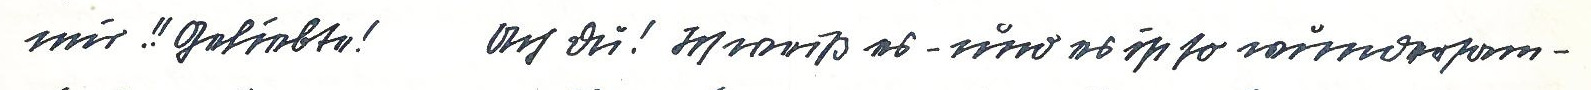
mir!! Geliebte! Ach Du! Ich weiß es – und es ist so wundersam
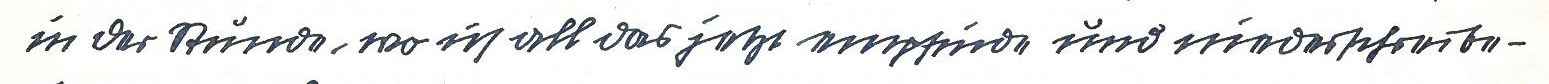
in der Stunde, wo ich all das jetzt empfinde und niederschreibe –
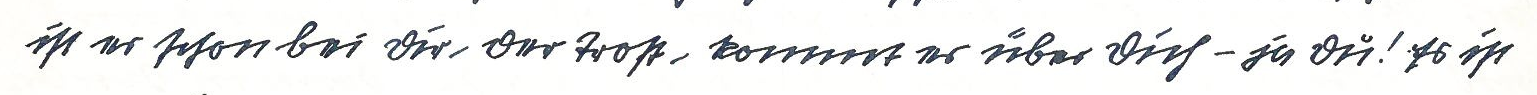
ist er schon bei Dir, der Trost, kommt er über Dich – ja, Du! Es ist
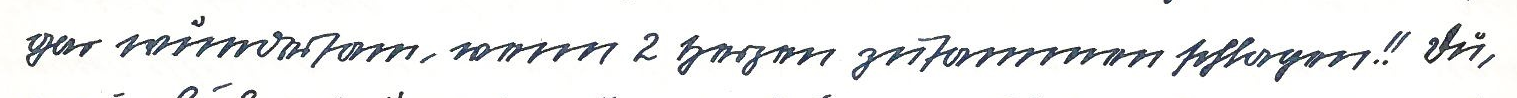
gar wundersam, wenn 2 Herzen zusammen schlagen!! Du,
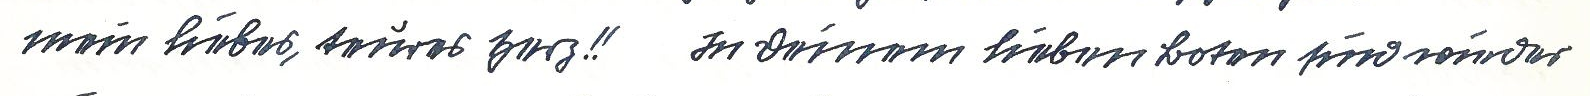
mein liebes, teures Herz!! In Deinem lieben Boten sind wieder
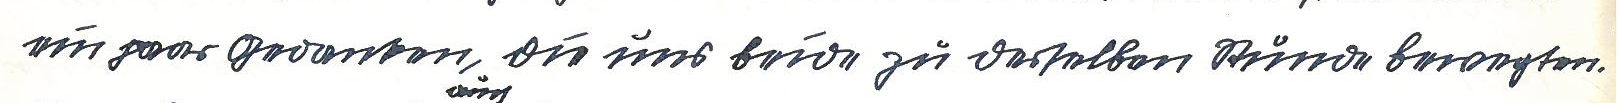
ein paar Gedanken, die uns beide zu derselben Stunde bewegten.
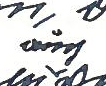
auch
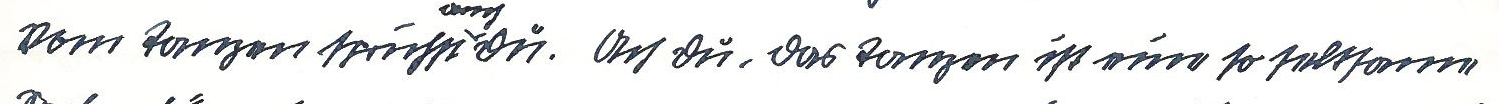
Vom Tanzen sprichst Du. Ach Du, das Tanzen ist eine so seltsame
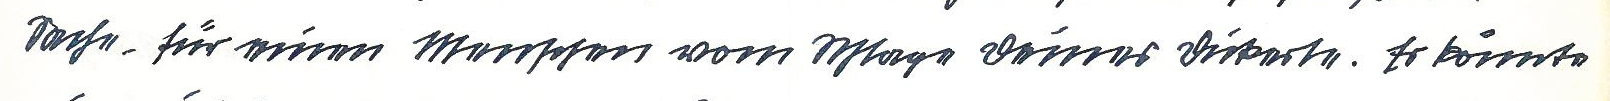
Sache, für einen Menschen vom Schlage Deines Dickerle. Es könnte
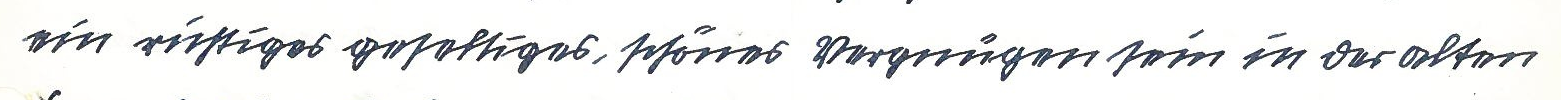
ein richtiges, geselliges, schönes Vergnügen sein in der alten
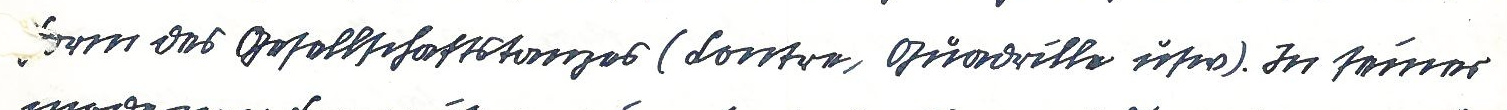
rm des Gesellschaftstanzes (Contre, Quadrille usw). In seiner
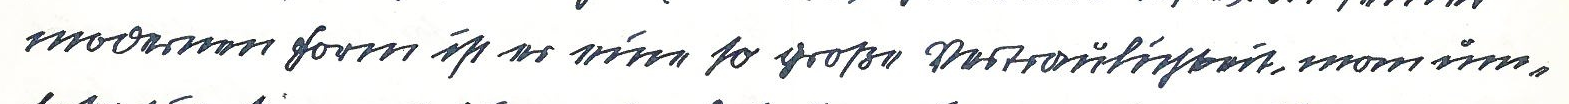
modernen Form ist er eine so große Vertraulichkeit, man um¬
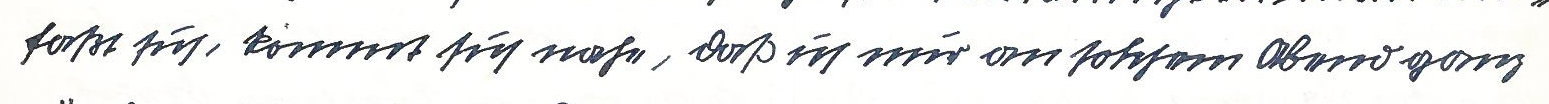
faßt sich, kommt sich nahe, daß ich mir an solchem Abend ganz
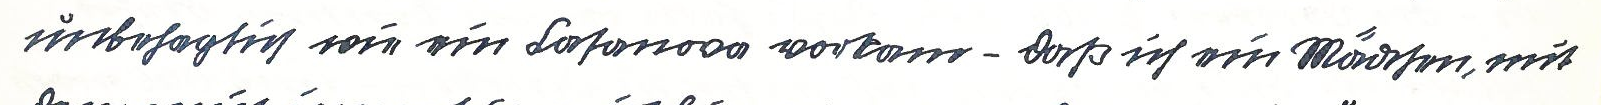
unbehaglich wie ein Casanova vorkam – daß ich ein Mädchen, mit
